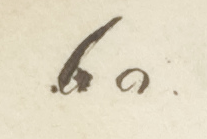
60.
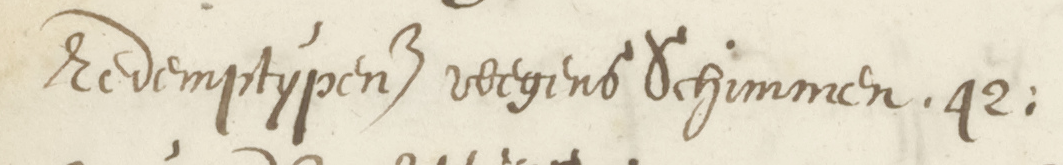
Redemptijpen, wegens Schimmen. 42:
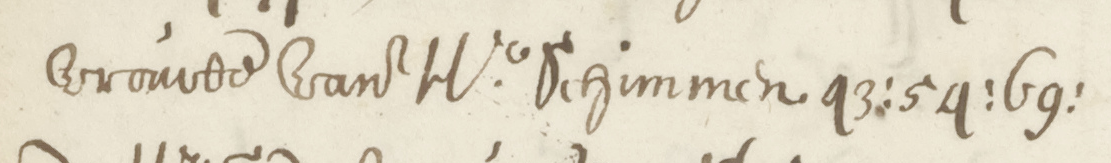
vrouwe van Hr. Schimmen 43: 54: 69:
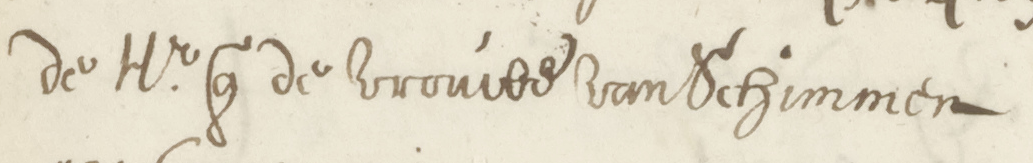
de Hr. Ca. de vrouwe van Schimmen
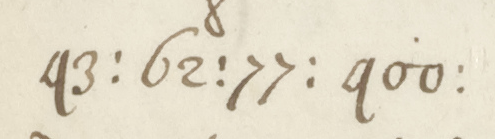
43: 62: 77: 400:
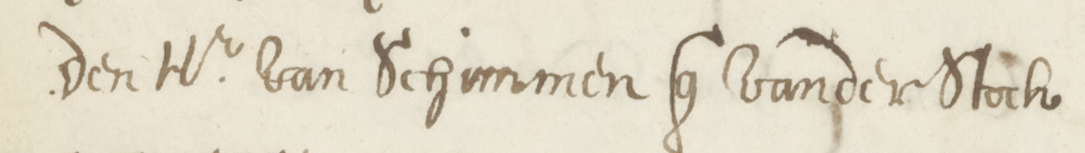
den Hr. van Schimmen Ca. vander Stock
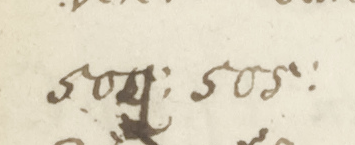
504: 505:
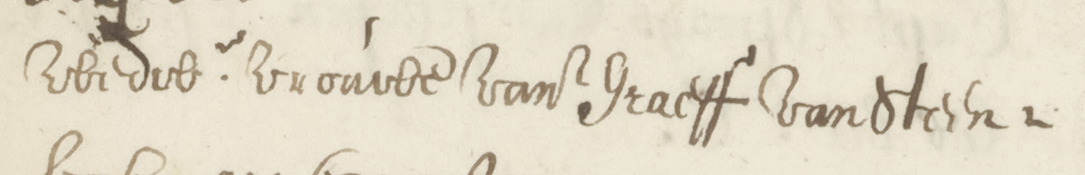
wedwe. Vrouwe van Graeff van Steen„
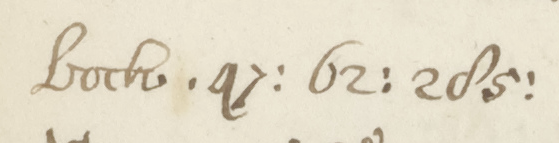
bock. 47: 62: 285:
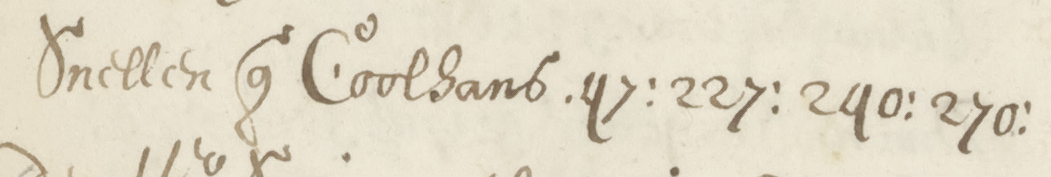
Snellen Ca. Coolhans. 47: 227: 240: 270:
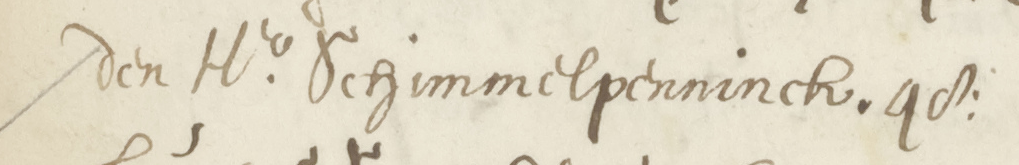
den Hr. Schimmelpenninck. 48:
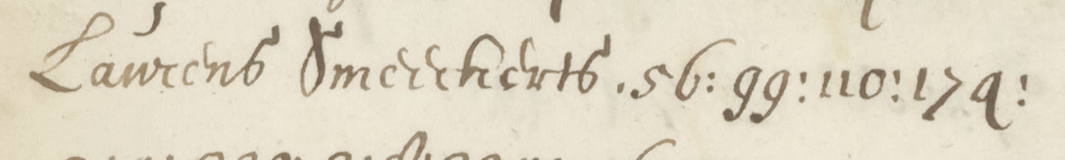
Laurens Smeeckerts. 56: 99: 110: 174:
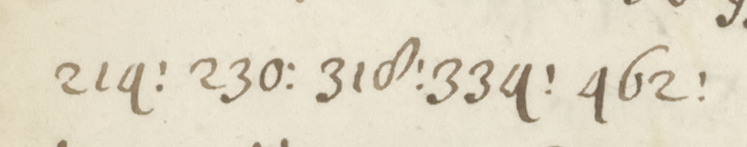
214: 230: 318: 334: 462:
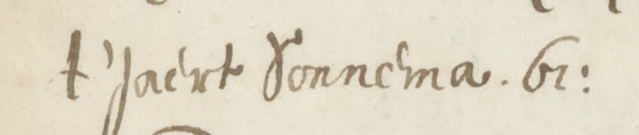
t'Jaert Sonnema. 61:
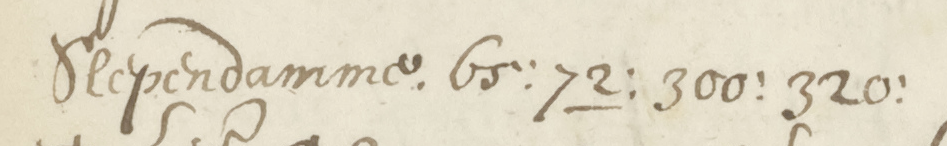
Slependamme. 65: 72: 300: 320:
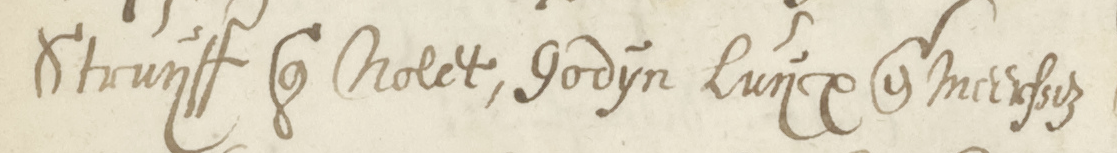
Struijff Ca. Nolet, Godijn Luijcx & Meerssen
